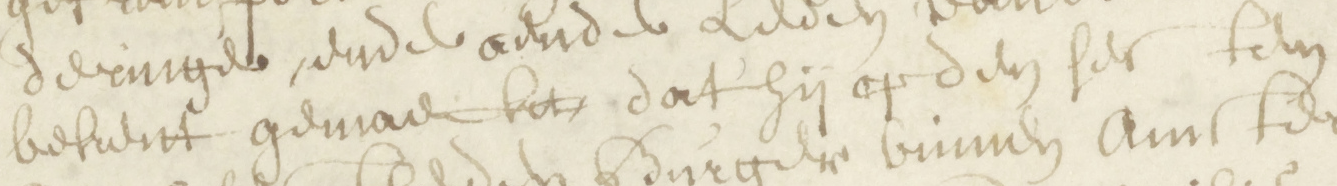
bekent gemaeckt, dat hij opden sesten
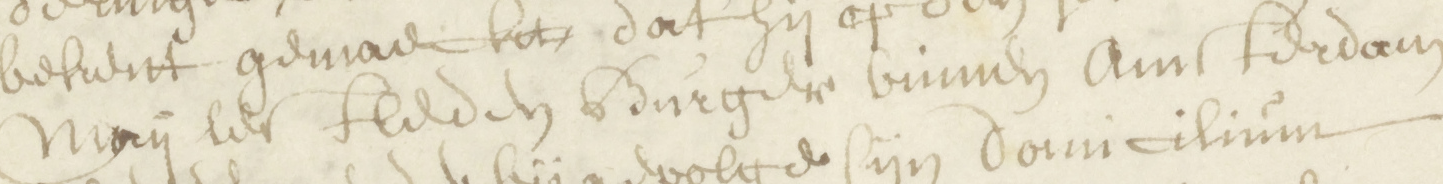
Maij lestleden Burger binnen Amsterdam
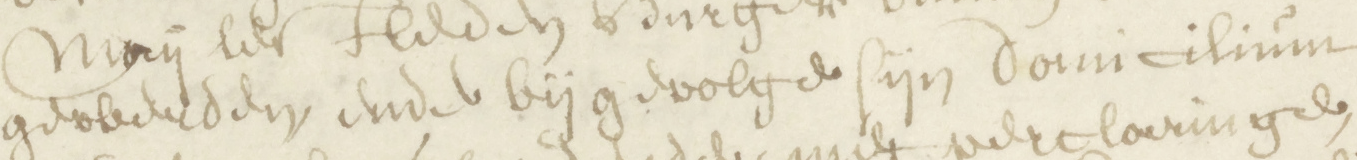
gewerden, ende bijgevolge sijn domicilium
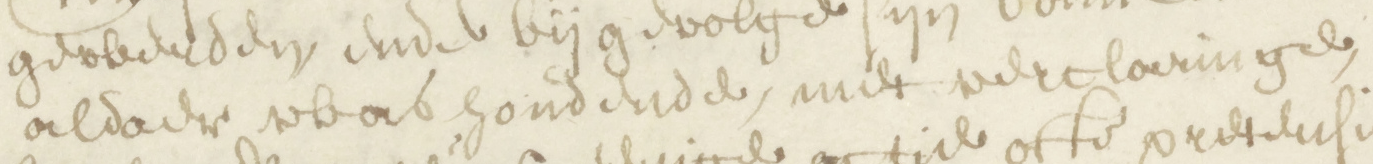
aldaer was houdende, met verclaringe,
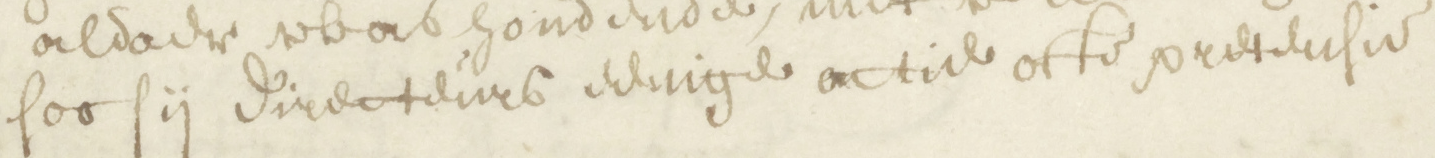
soo sij directeurs eenige actie ofte pretensie
